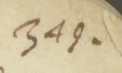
349.
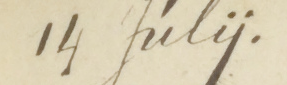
14 Julij.
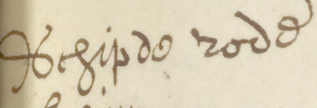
Schip de rode
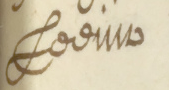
Leeuw
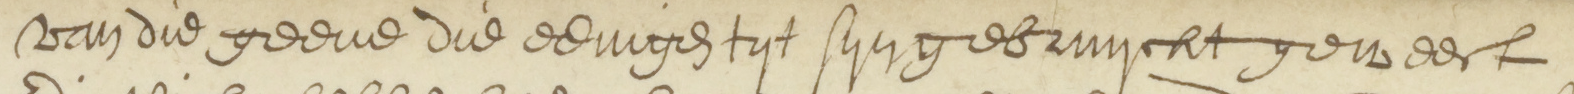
van die geene die eenigen tyt syn gebruyckt geweest
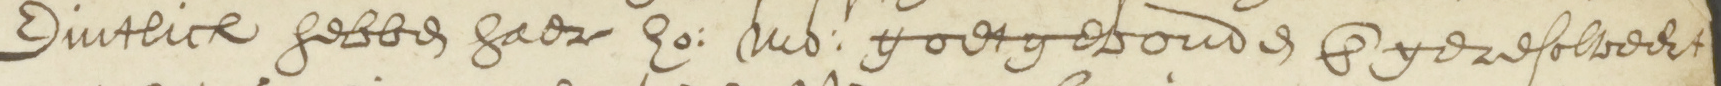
Eintlick hebben haer ho:mo: goetgevonden & geresolveert
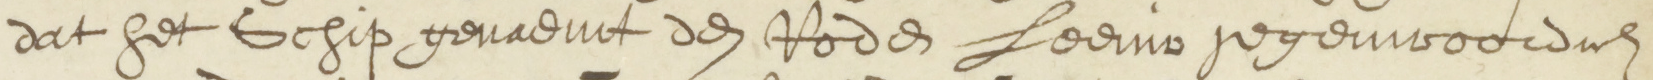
dat het Schip genaemt den Roden Leeuw jegenwoordich
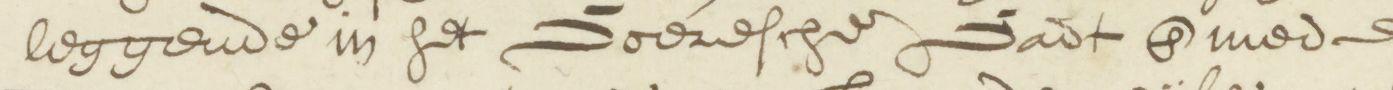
leggende in het Goeresche Gadt & mede
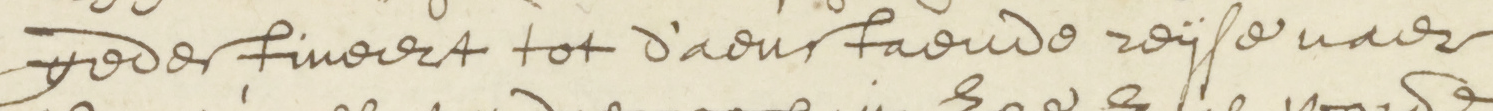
gedestineert tot d‛aenstaende reijse naer
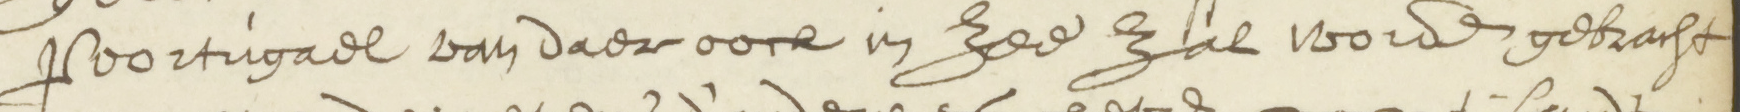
Poortugael van daer oock in Zee Zal worden gebracht
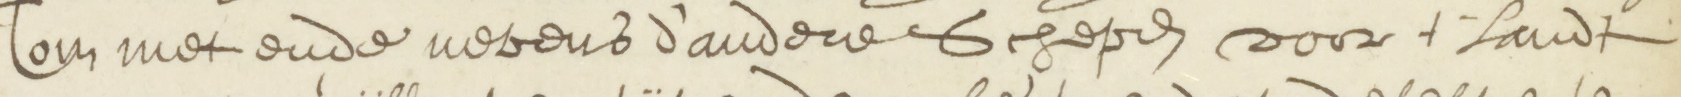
om met ende nevens d‛andere Schepen voor t‛ Landt
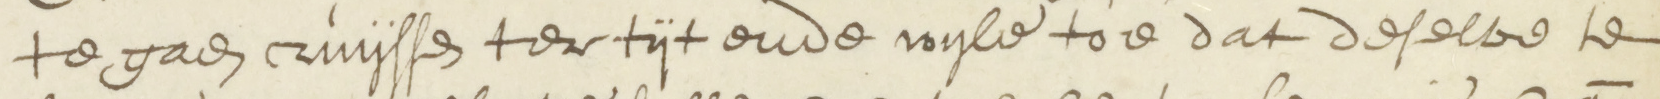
te gaen cruijssen ter tijt ende wyle toe dat deselve te
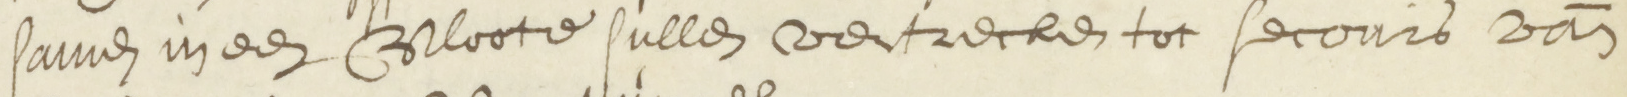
samen in een Vloote sullen vertrecken tot secours van
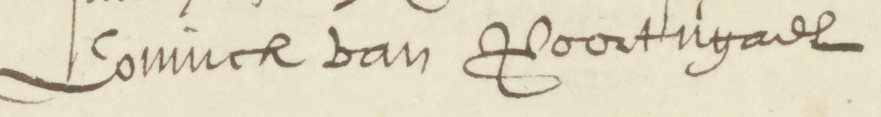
Coninck van Poortugael.
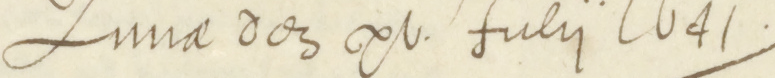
Lunæ den xv. Julij 1641.
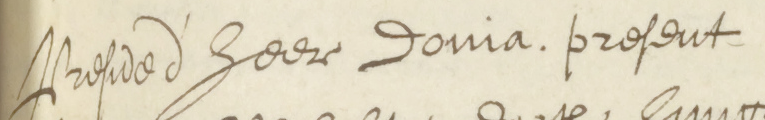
Preside d‛ heer Donia. present
